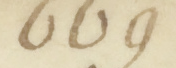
669
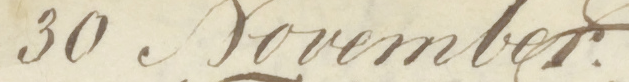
30 November.
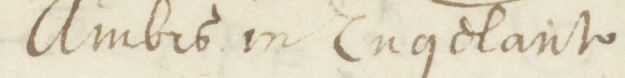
Ambrs. in Engelant
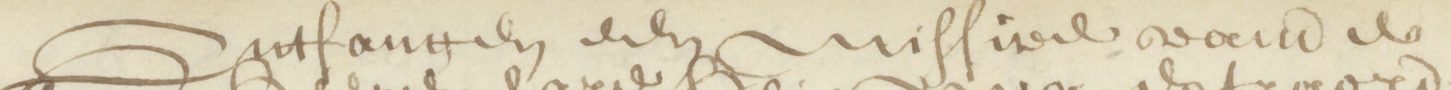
Ontfangen een Missive vande
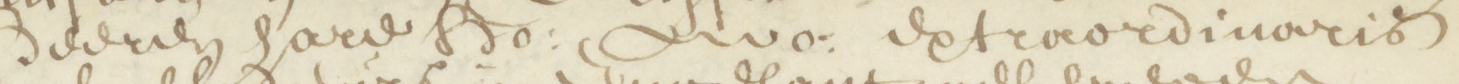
Heeren hare Ho:Mo: extraordinaris
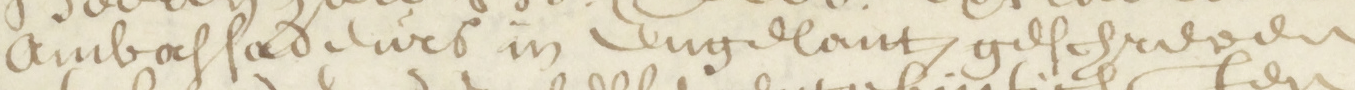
Ambassadeurs in Engelant, geschreven
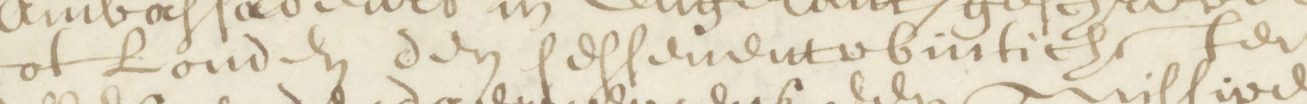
tot Londen den sessenentwintichsten
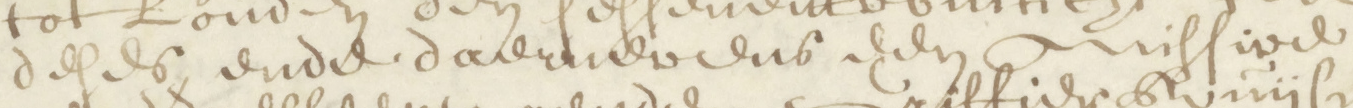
deses, ende daernevens een Missive
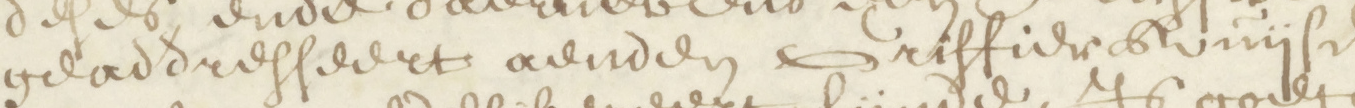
geaddresseert aenden Griffier Ruijsch.
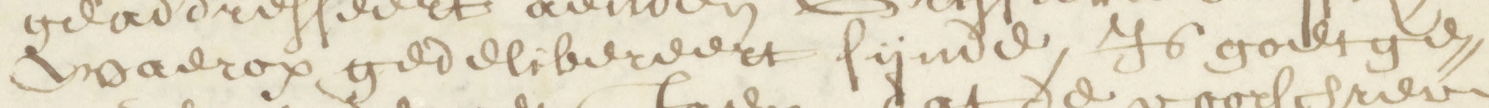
Waerop gedelibereert sijnde, Is goetge„
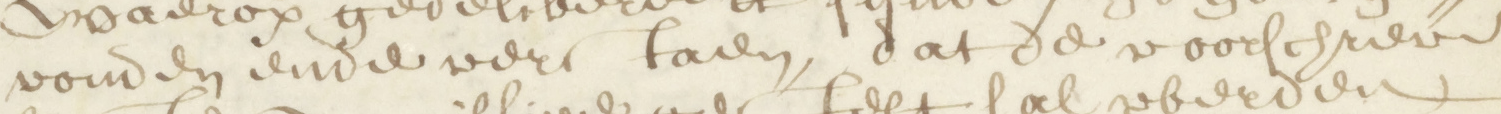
vonden ende verstaen, dat de voorschreve
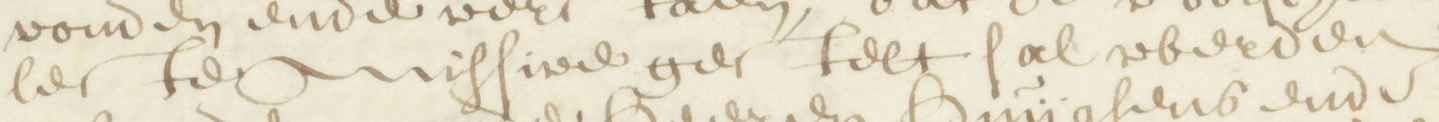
leste Missive gestelt sal werden
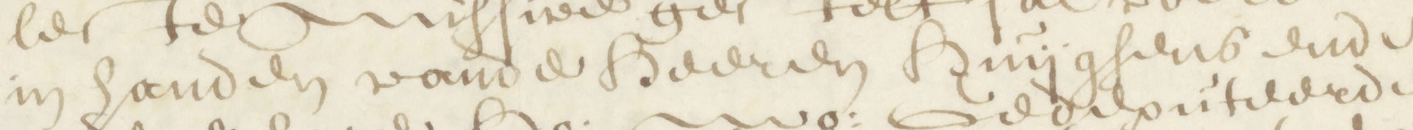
in handen vande Heeren Huijghens ende
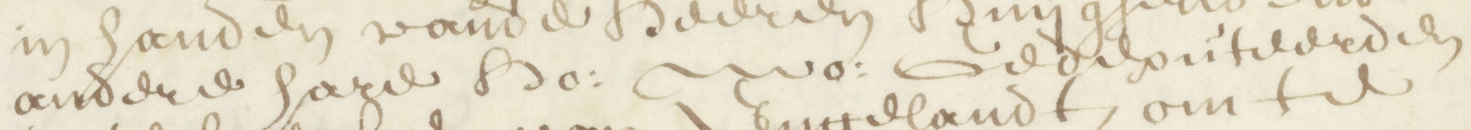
andere hare Ho:Mo: Gedeputeerden
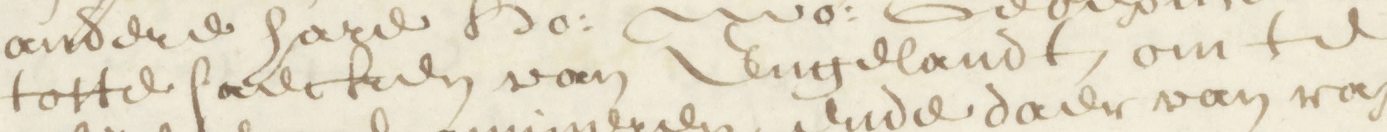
totte saecken van Engelandt, om te
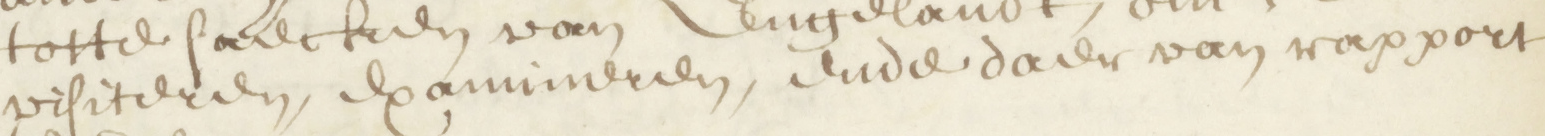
visiteren, examineren, ende daer van rapport
